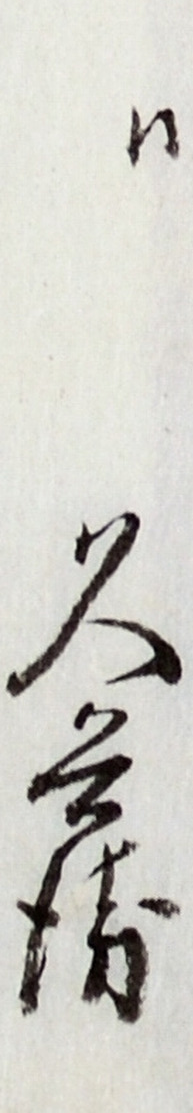同久兵衛

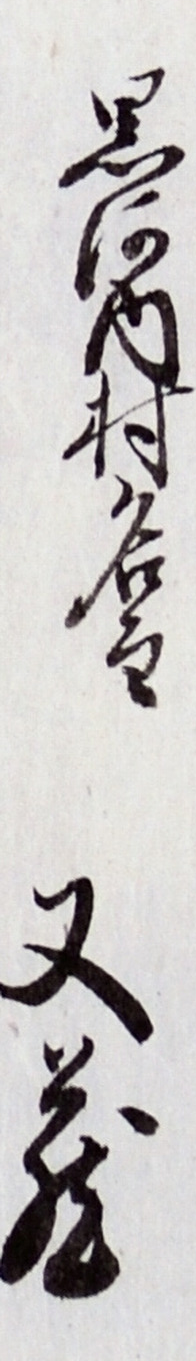黒河村名主又蔵
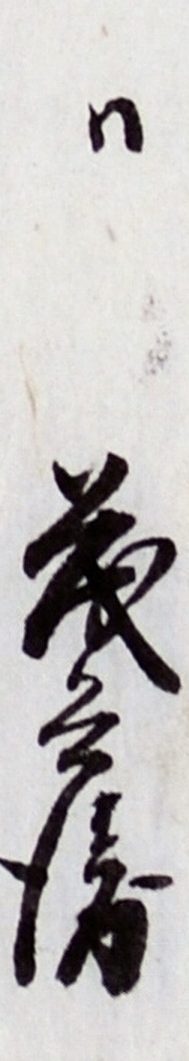同茂兵衛
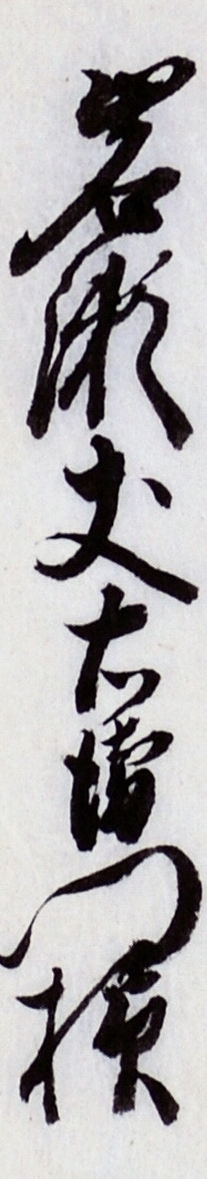岩瀬丈右衛門様
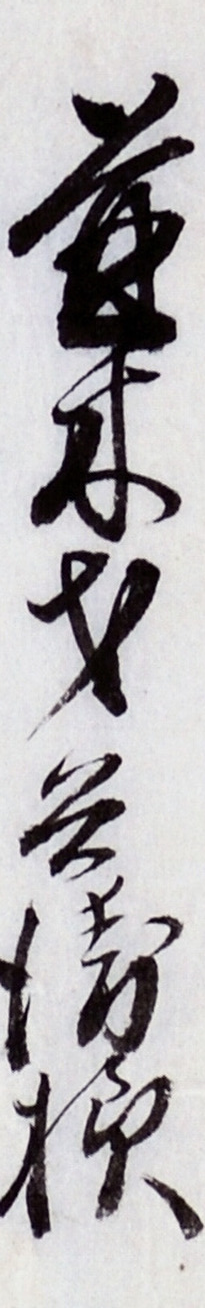並木才兵衛様
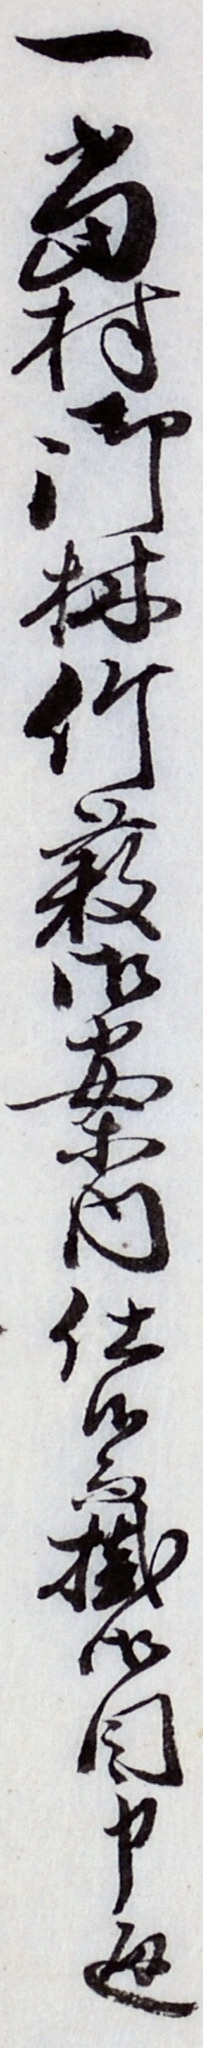一当村御林竹薮御案内仕候而掛御目申通
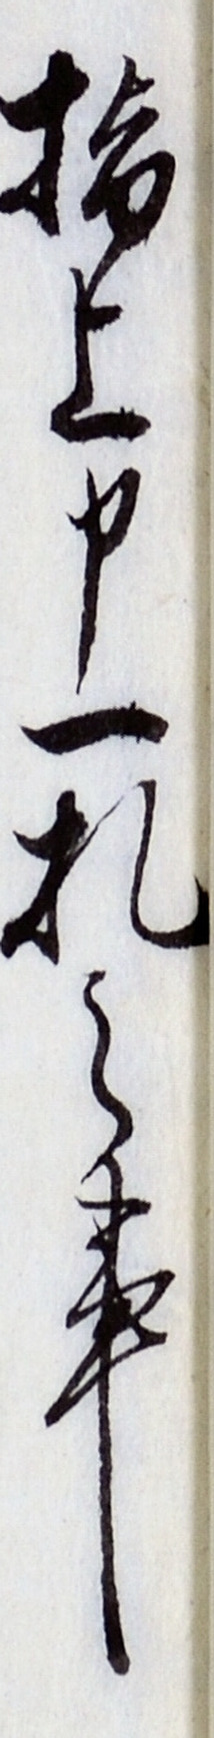指上申一札之事
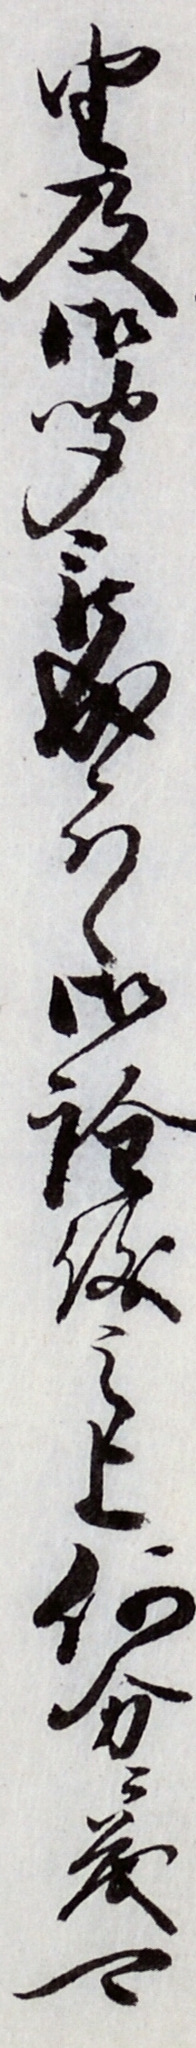由及御聞被成候ハヽ御詮議之上何分ニも可
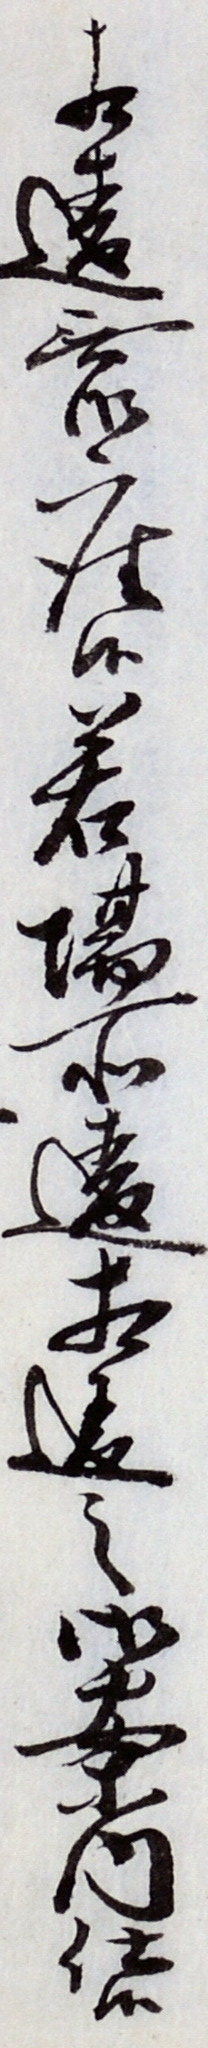相違無御座候若場所違相違之御案内仕候
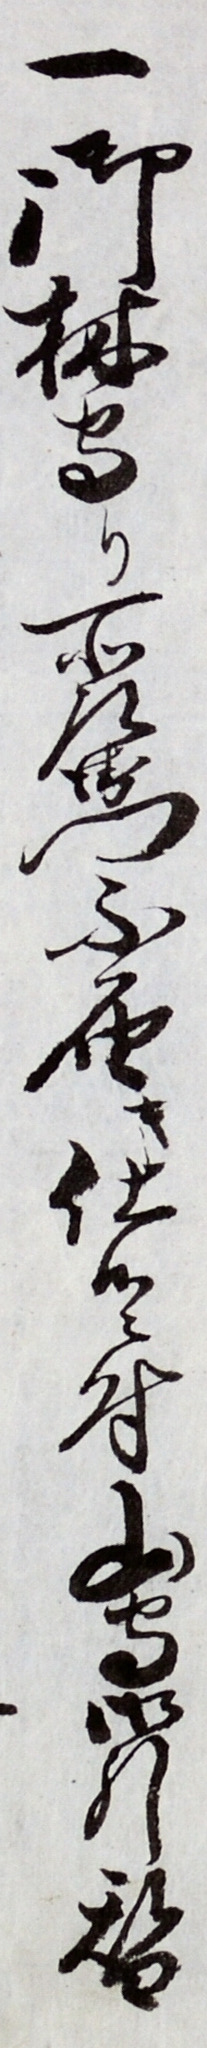一御林守り所左衛門不届キ仕候ニ付山守御引替
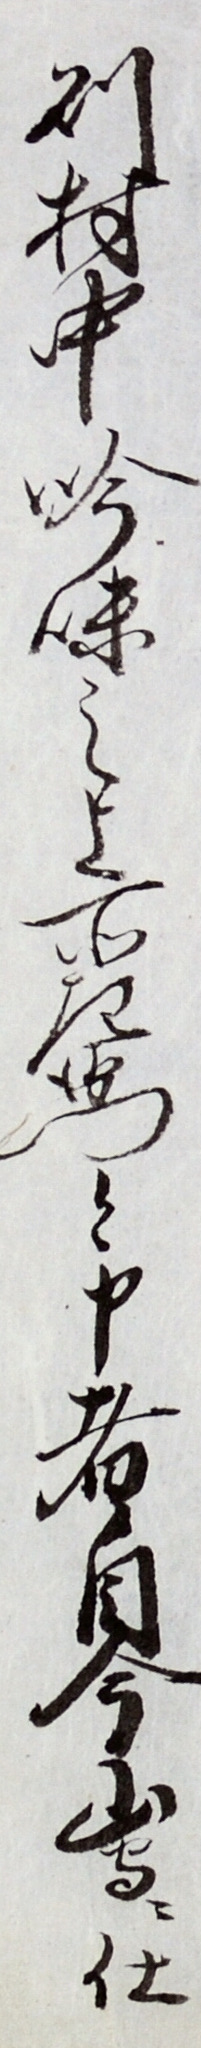則村中吟味之上所左衛門之申は自今山守ニ仕
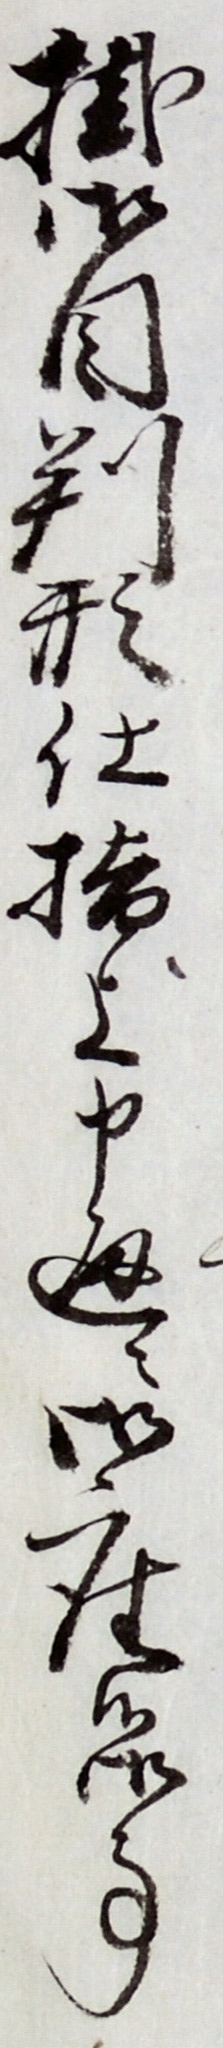掛御目判形仕指上申通ニ御座候御事

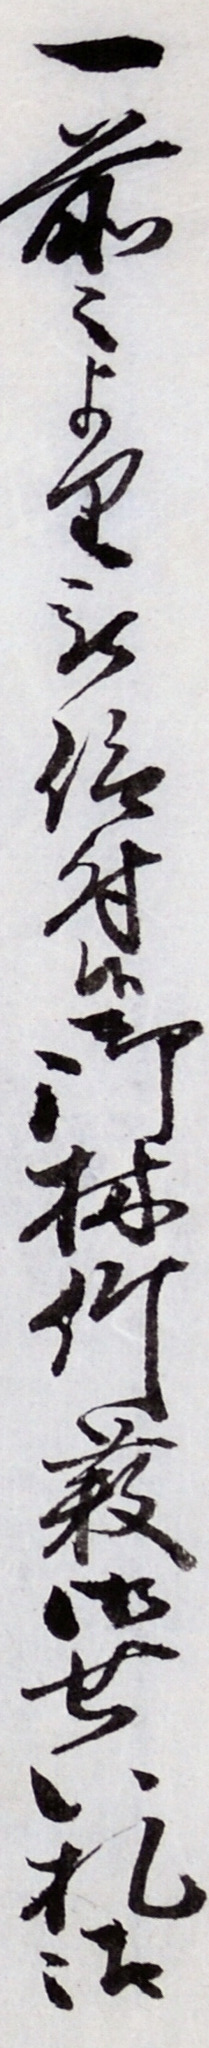一前々より被仰付候御林竹薮御せい札御
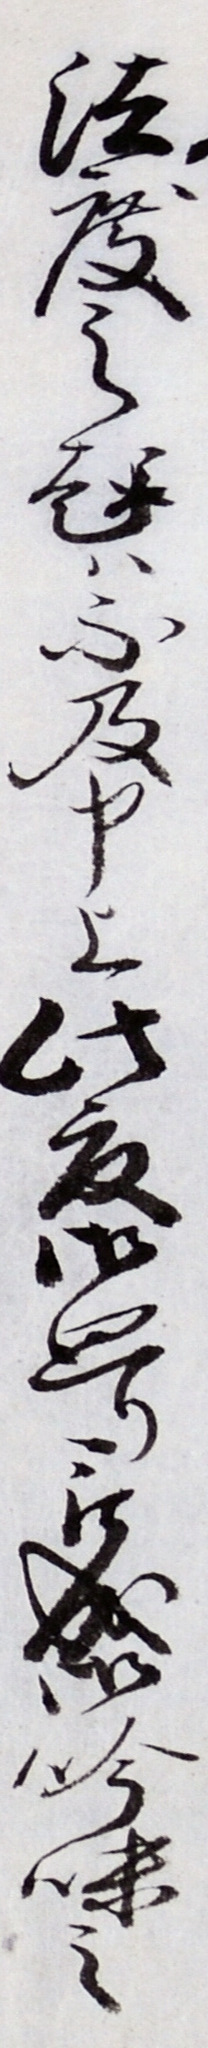法度之趣ハ不及申上此度御廻り被成御吟味之
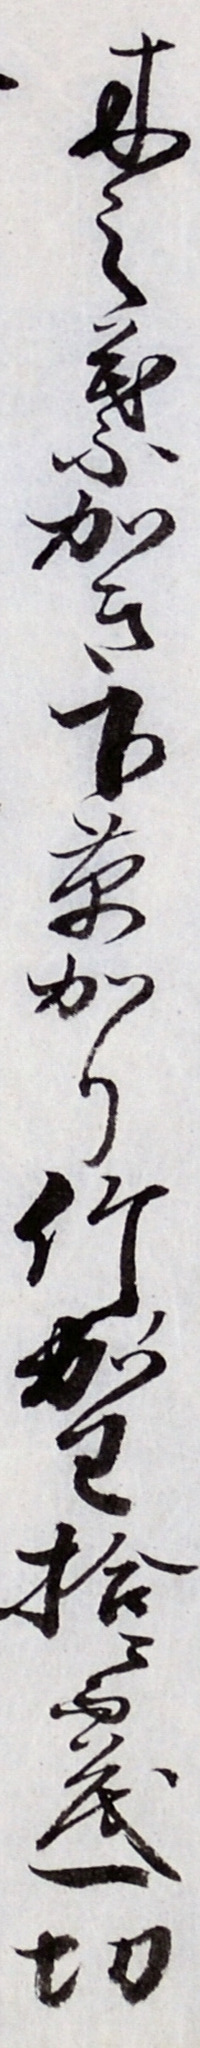木之葉かき下草かり竹ノかわ拾ニ而も一切
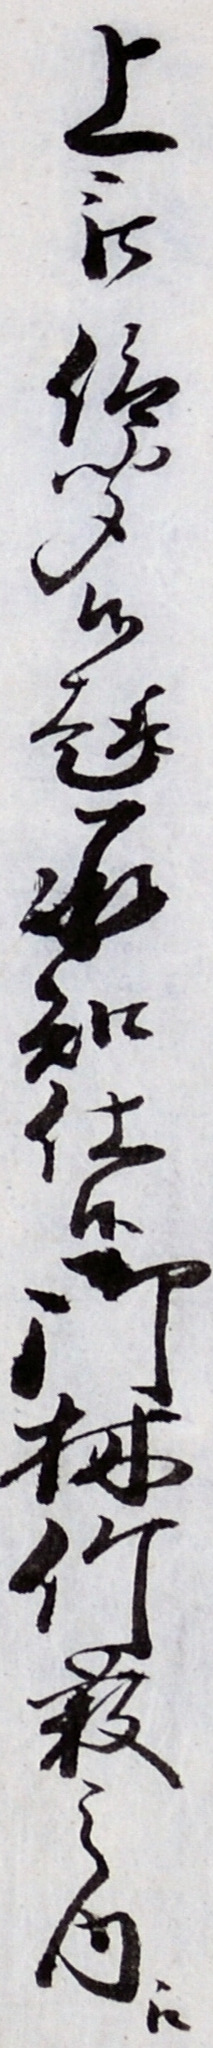上被仰聞候趣承知仕候御林竹薮之内え
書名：御林御竹藪証文控
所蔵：伊那市立高遠町図書館・合同会社AMANE
